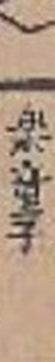楽童子
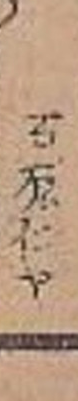石原仁ヤ
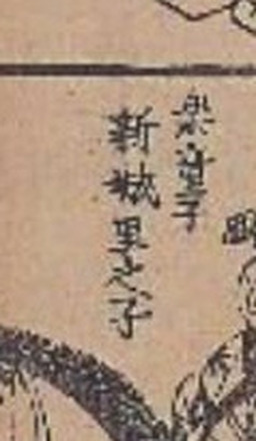新城里之子
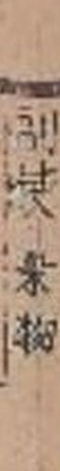副使乗物
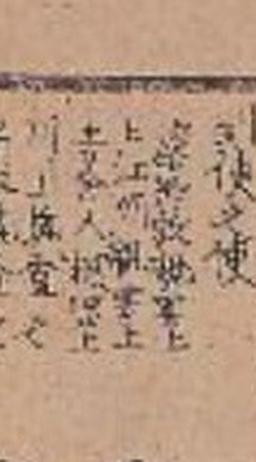上間親雲上
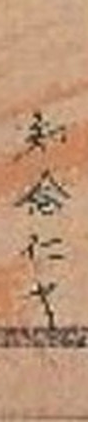知念仁ヤ
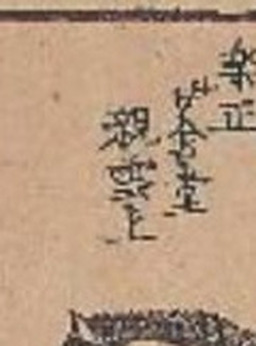親雲上
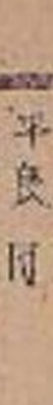平良同
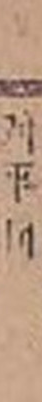川平同
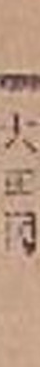大田同
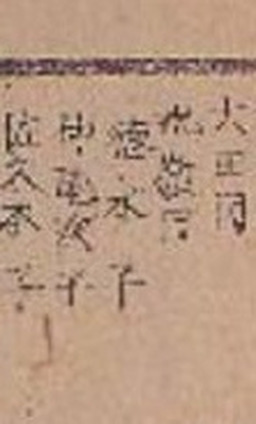徳永子
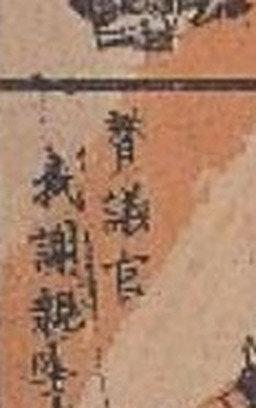賛議官
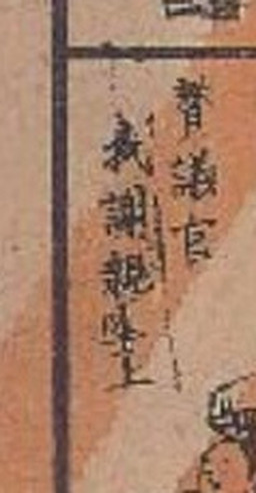我謝親雲上
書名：琉球人行列附 嘉永三庚戌年十一月
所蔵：University of the Ryukyus Library
